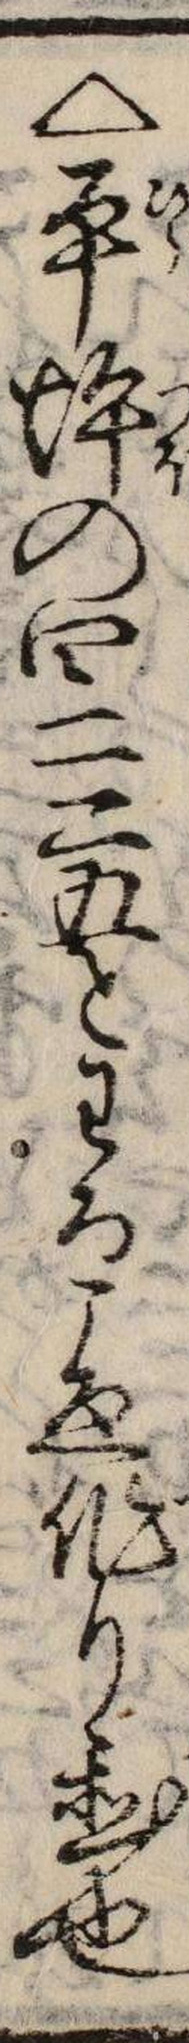△平坪の四二二五とわるこゑ作り置也
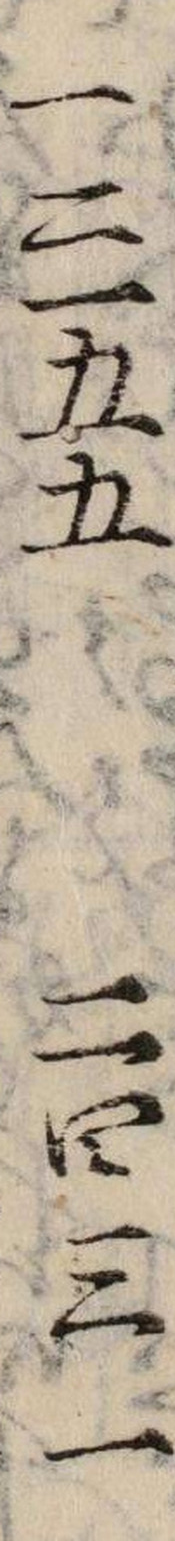一二一五五二四三一
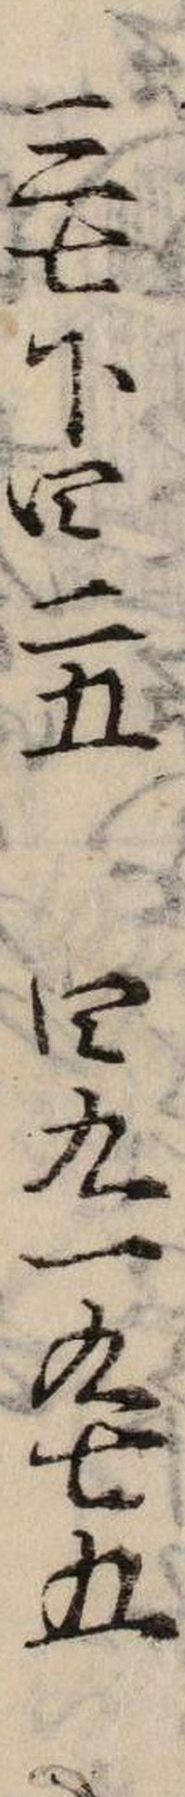三七下四二五四九一九七五
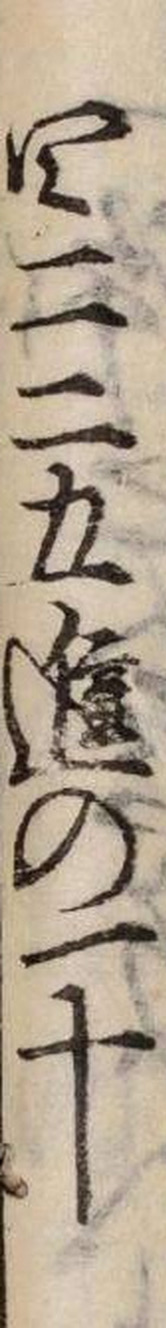四二二五進の一十
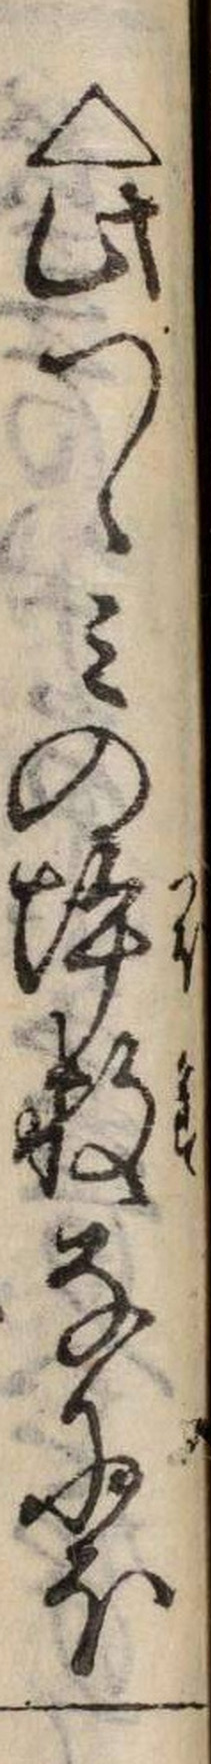△此つつみの坪数なにほ
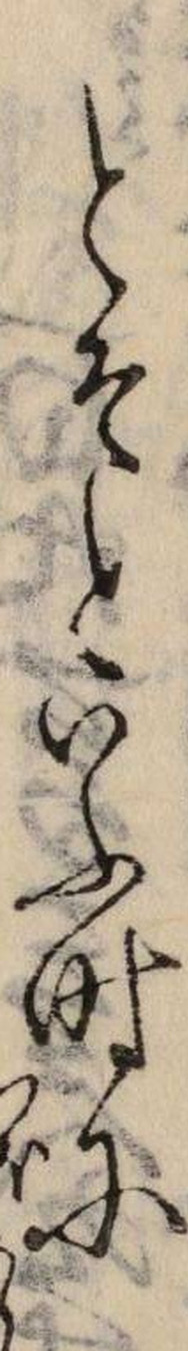とそといふ時に
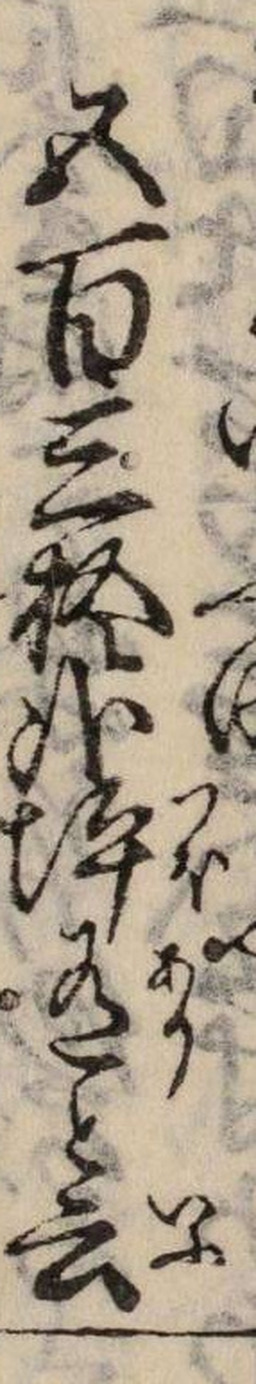五百三拾弐坪有と云
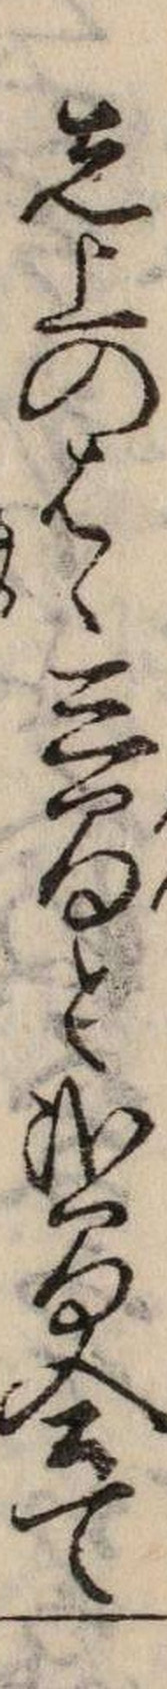先上のはは三間と弐間合て
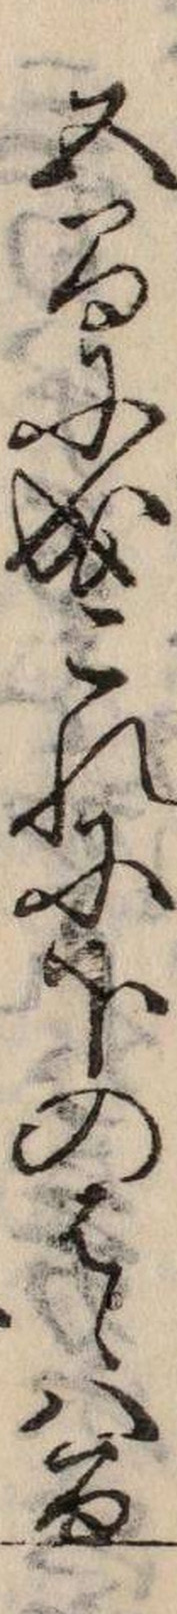五間に成これに下のはは八間
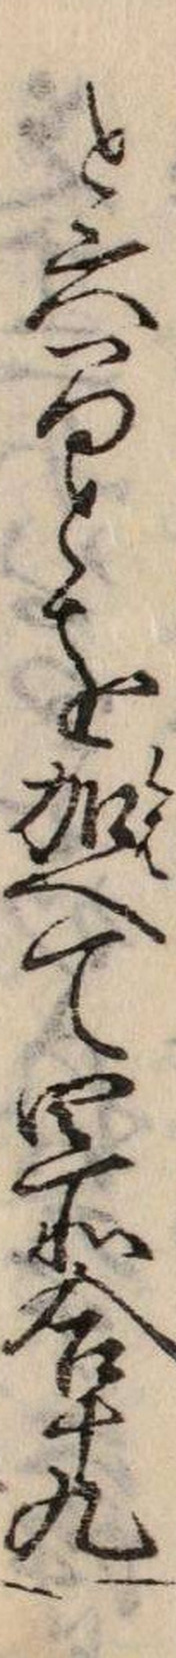と六間とを加へて四所合十九
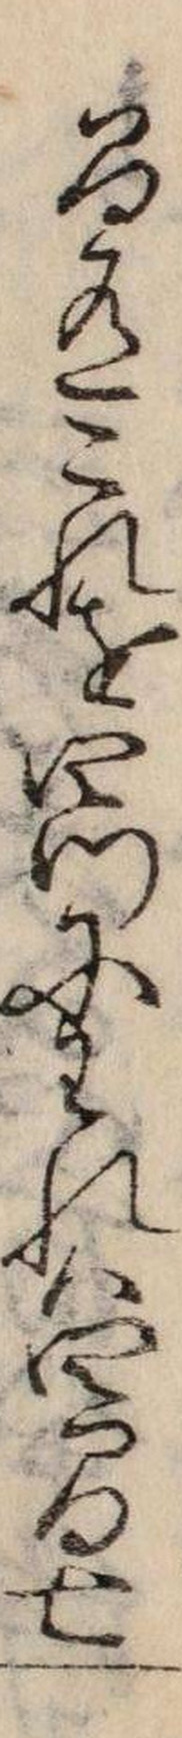間有これを四つにわれは四間七
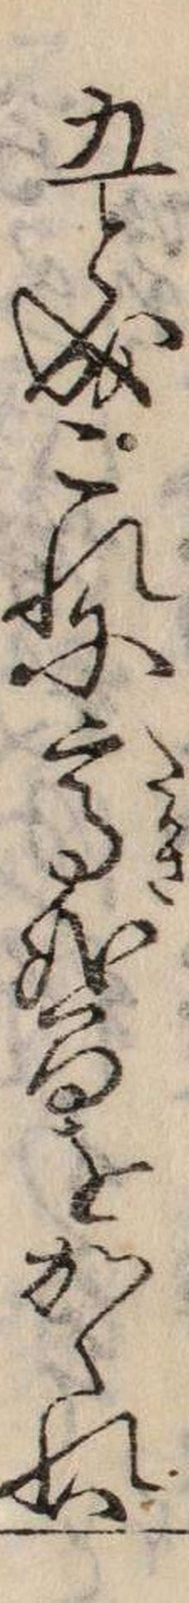五と成これに高弐間をかくれは
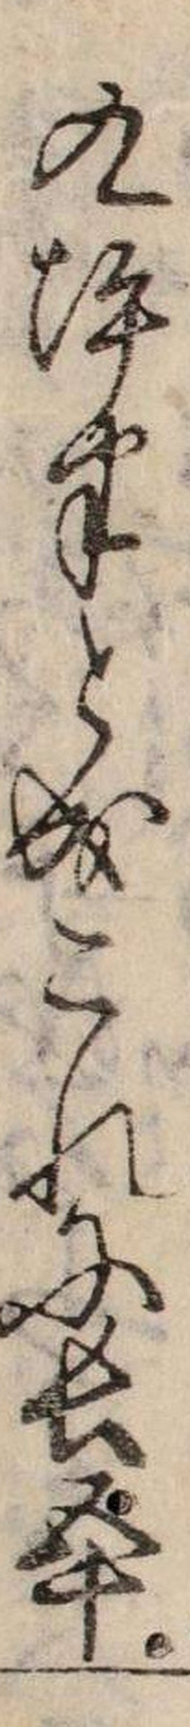九坪半と成これに長五十
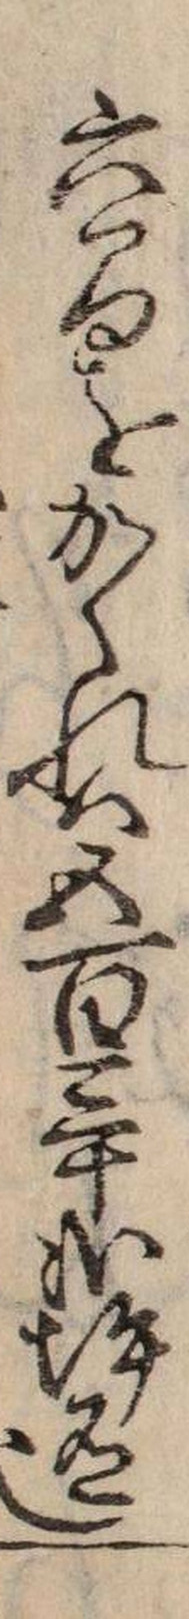六間をかくれは五百三十弐坪有也

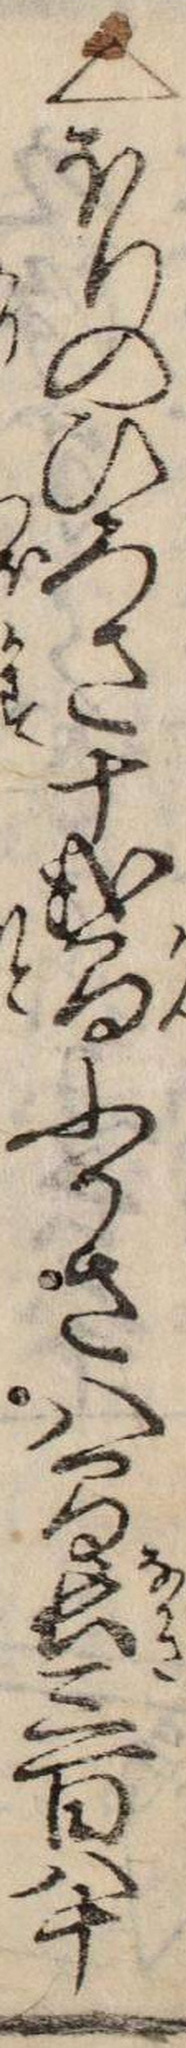△ほりのひろさ十弐間ふかさ八間長三百八十
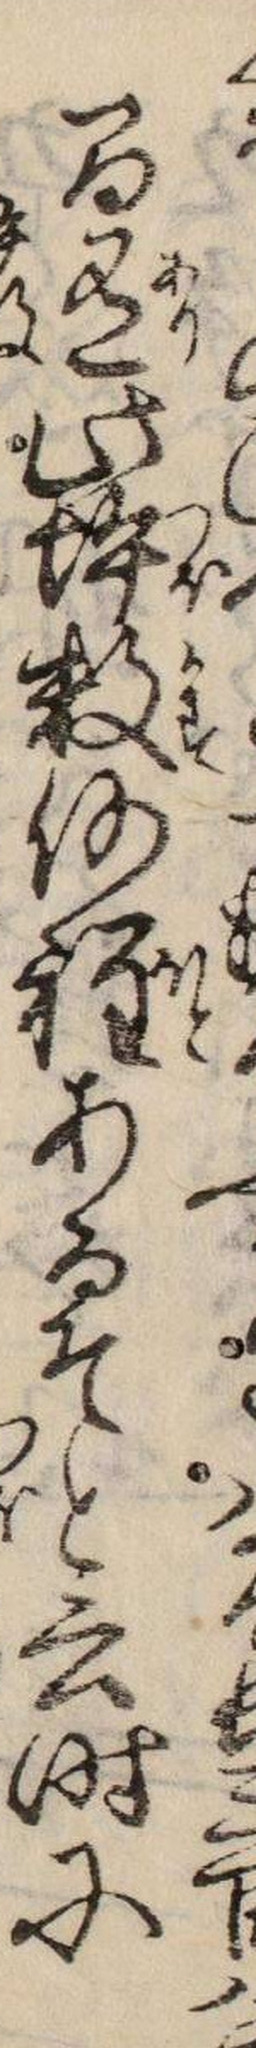間有此坪数何程あるそと云時に
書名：塵劫記（寛永11年自跋、京都府立京都学・歴彩館追貴8）
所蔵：京都府立京都学・歴彩館 国文学研究資料館
